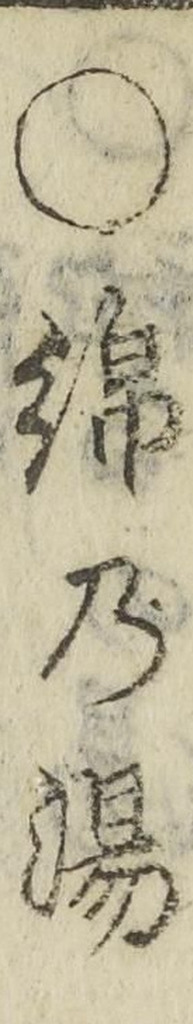◯綿の湯
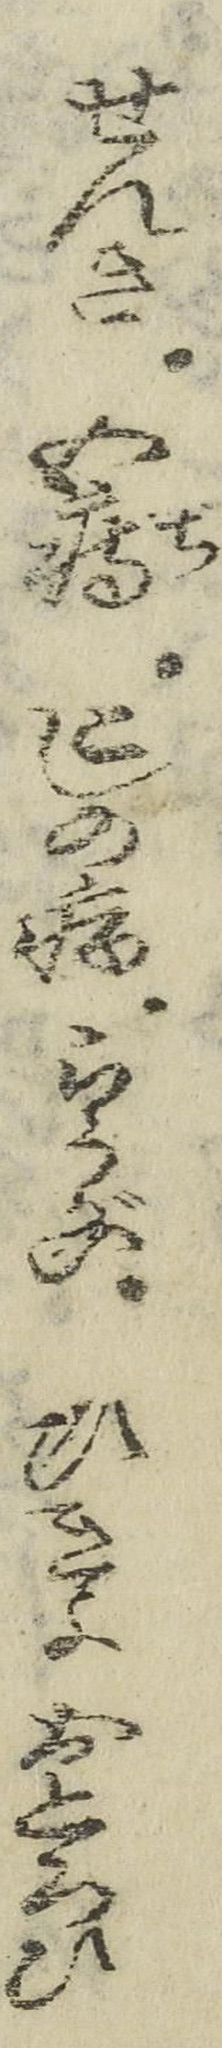せんき・五痔・こしの病・らうがい・ひきよ？おとろひ
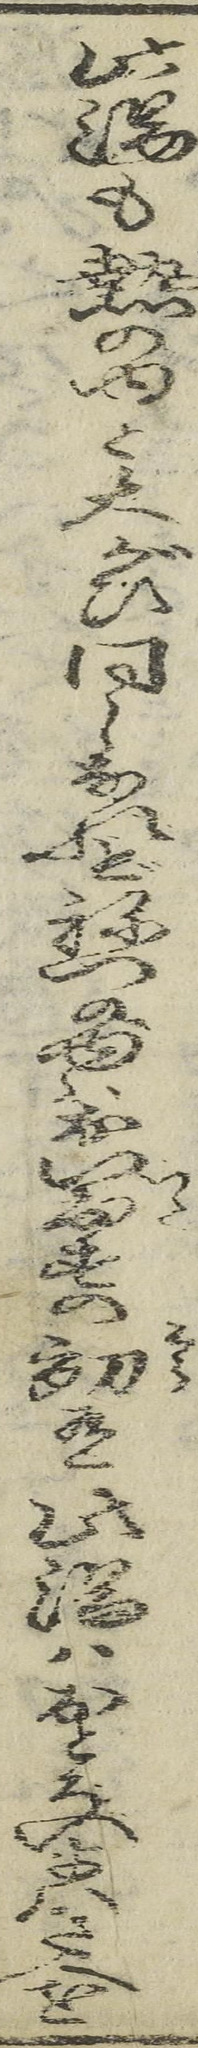此湯も熱のゆと大がひ同しなれどねつのゆはおい出すの効有此湯はおとろへよはき人を
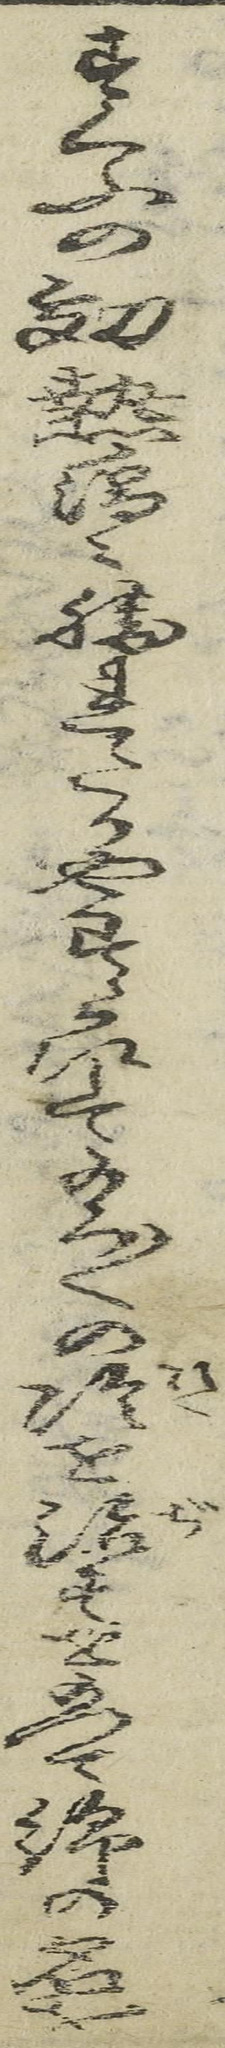すくふの効熱ノ湯に勝れたりやわらかにしてもろ〳〵の冷を治すをもつて綿の名を
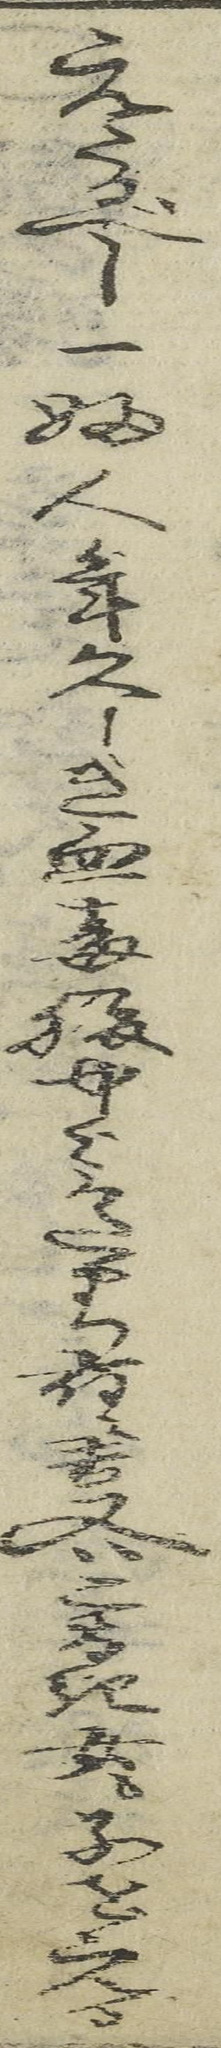えたるべし一婦人年久しき血毒腹中にかたまり有に吉又はこなき女も子をえる
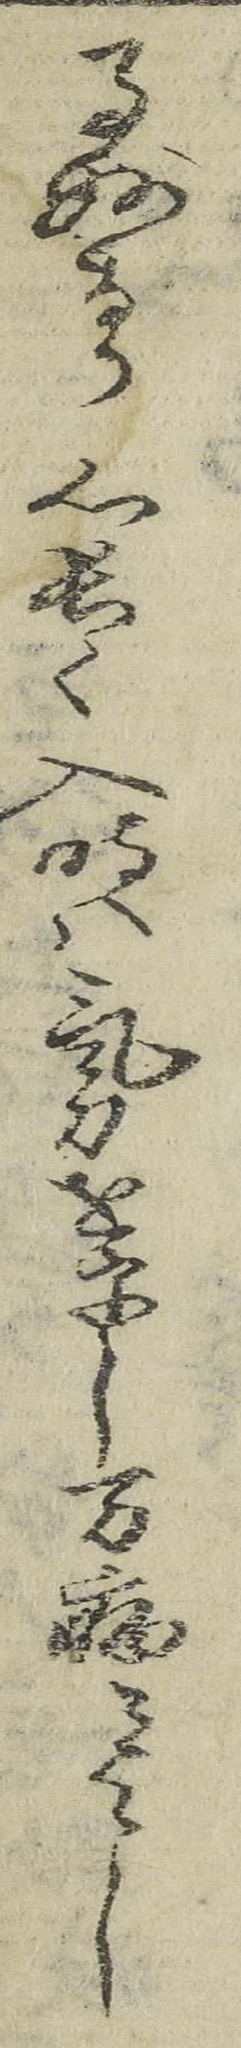事妙なり心長く入時は気力をまし万病によし

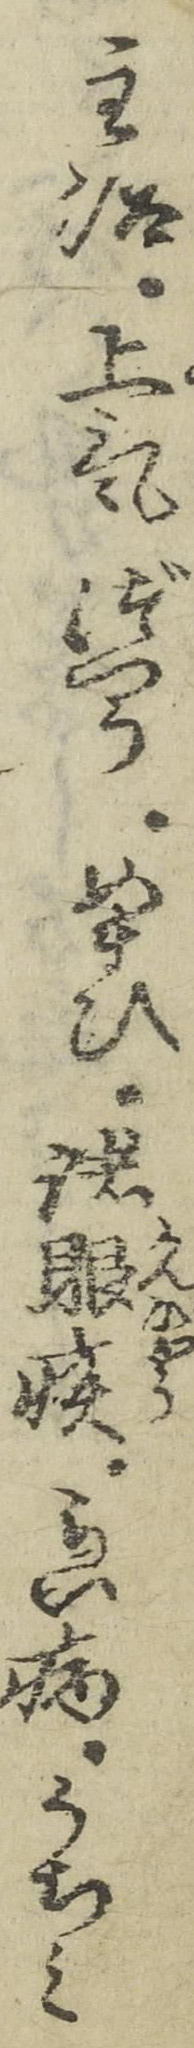主治・上気づつう・めまひ・諸眼病・らい病・うちみ
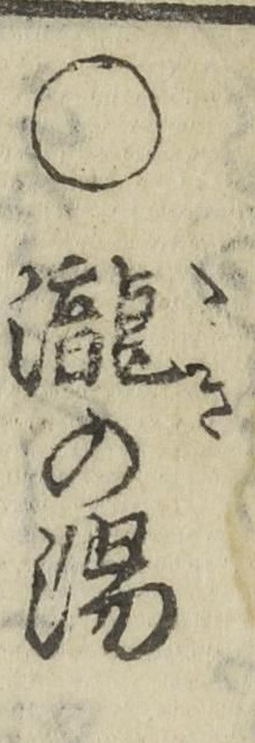〇瀧の湯
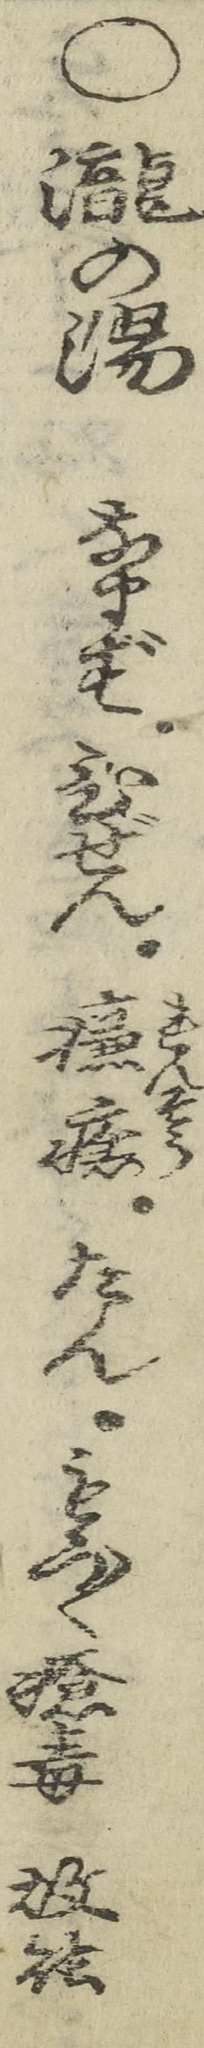なまず・ひぜん・㾾瘡・たん・もろ〳〵瘡毒放能
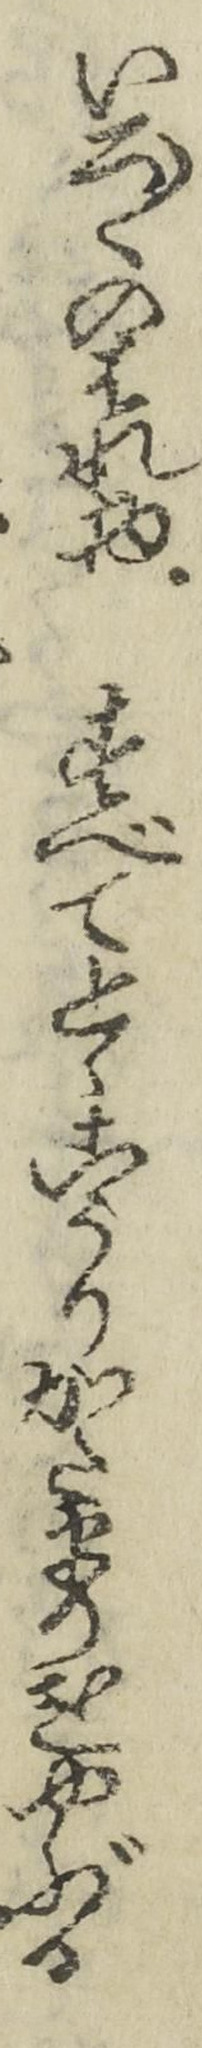いろ〳〵のはれ物・すべてとゝこうりかたまりをやぶる
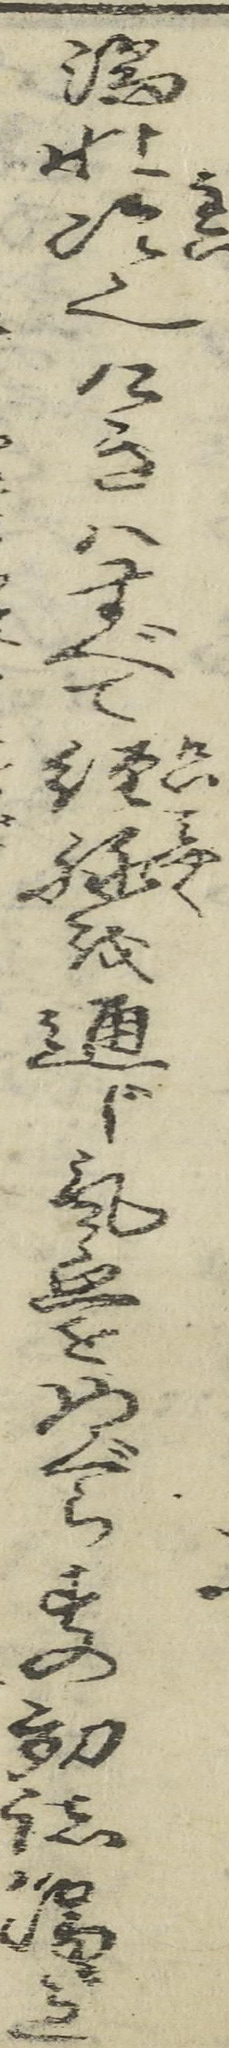湯性冷也けきはすべて経脈を通じ気血をめぐらすの効諸湯に過
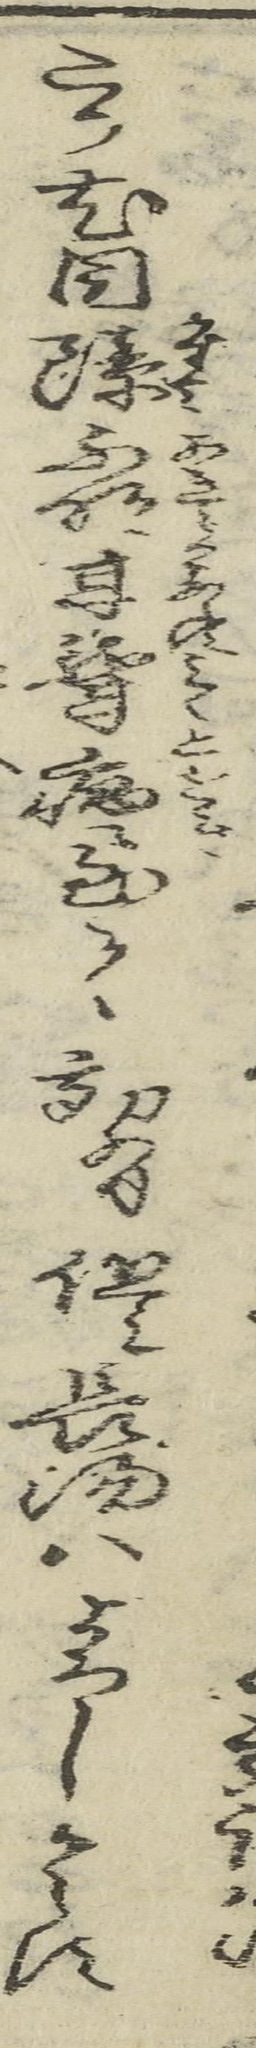たり尤目障不明耳聾病に至て効有但し長湯はよろしからす
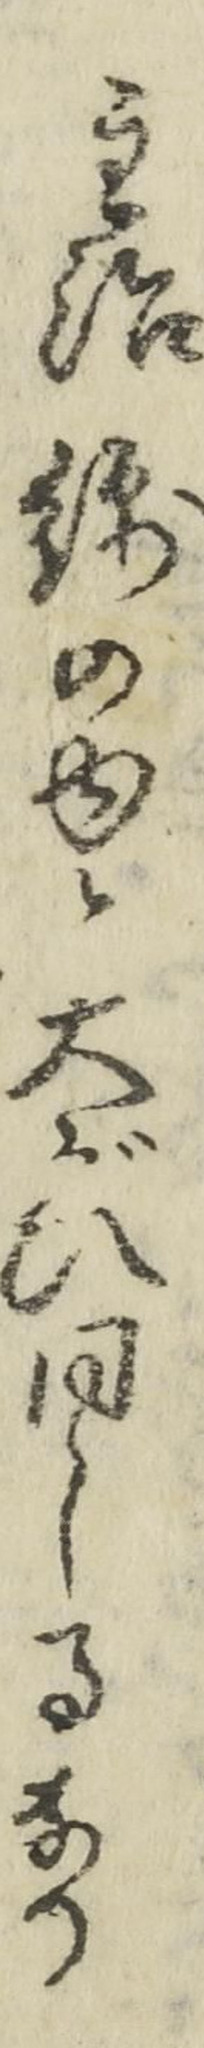主治綿のゆと大がひ同し事なり
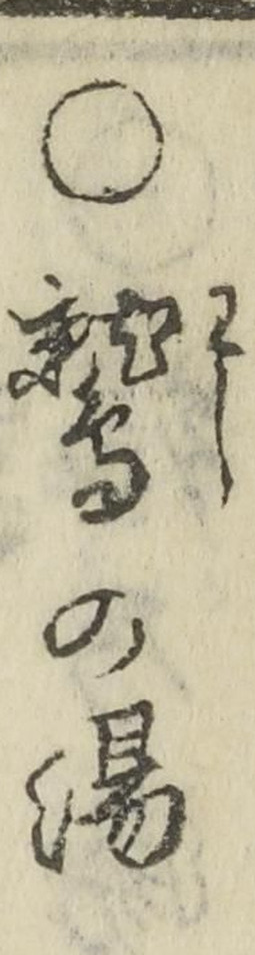〇鷲の湯
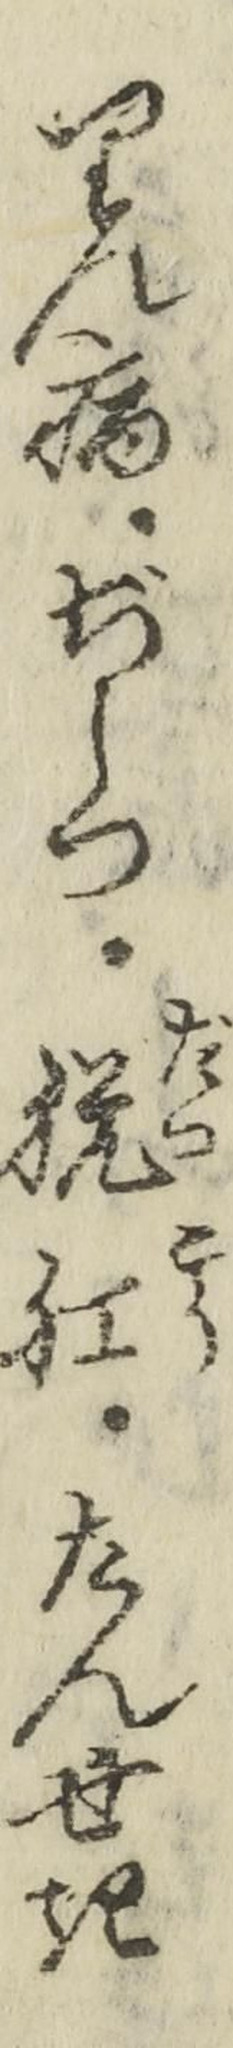りん病・ぢしつ・脱肛・たんせき
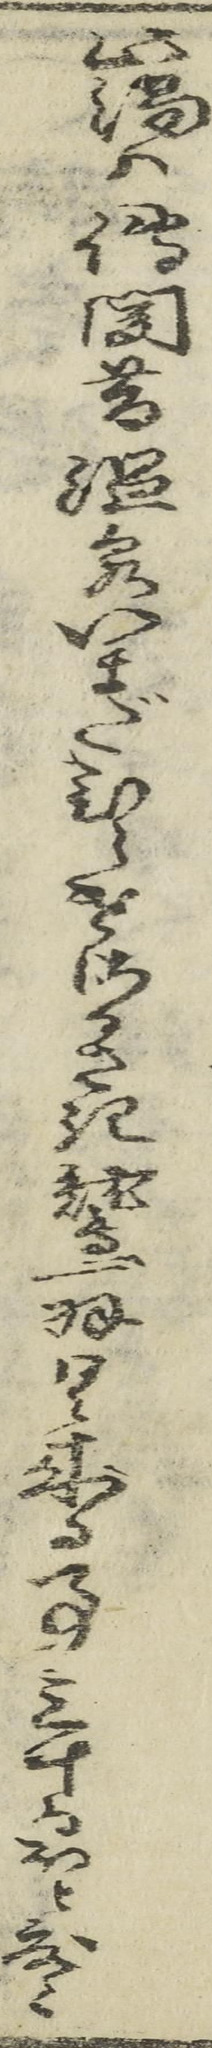此湯の傳聞等温泉いまだ至しをさりかたき鷲一羽日ゝ来る事三十日ほとなく
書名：草津温泉　入湯案内記
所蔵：東京大学地震研究所図書室 Earthquake Research Institute Library, The University of Tokyo, JAPAN
